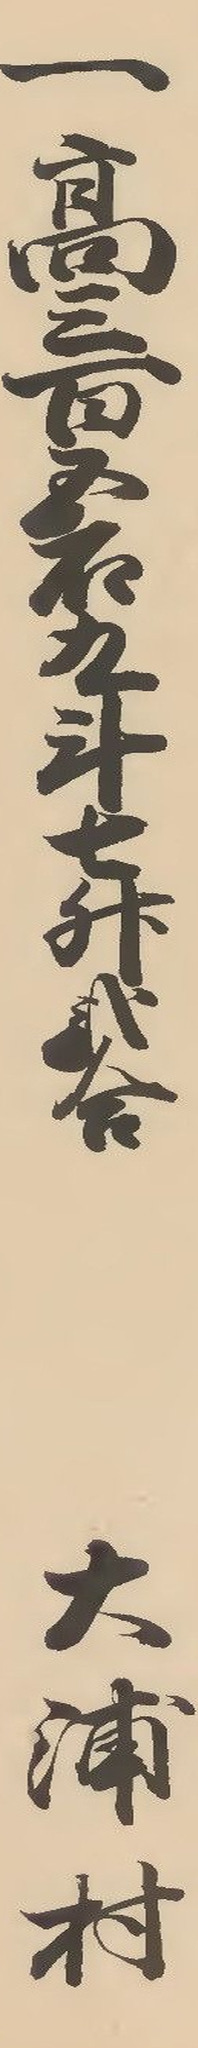一髙三百五石九斗七升弐合大浦村
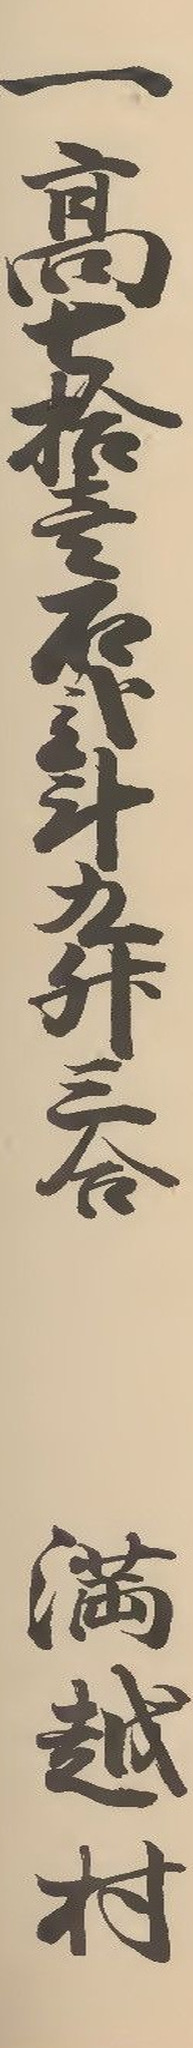一髙七拾壱石弐斗九升三合満越村
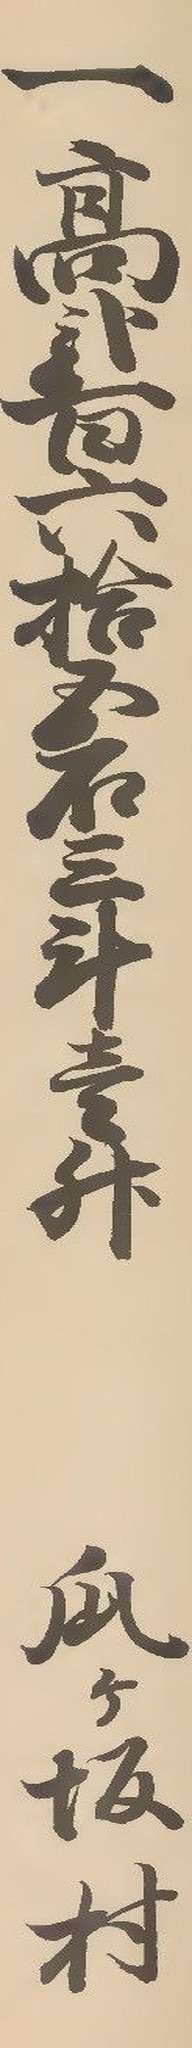一髙弐百六拾五石三斗壱升爪ケ坂村
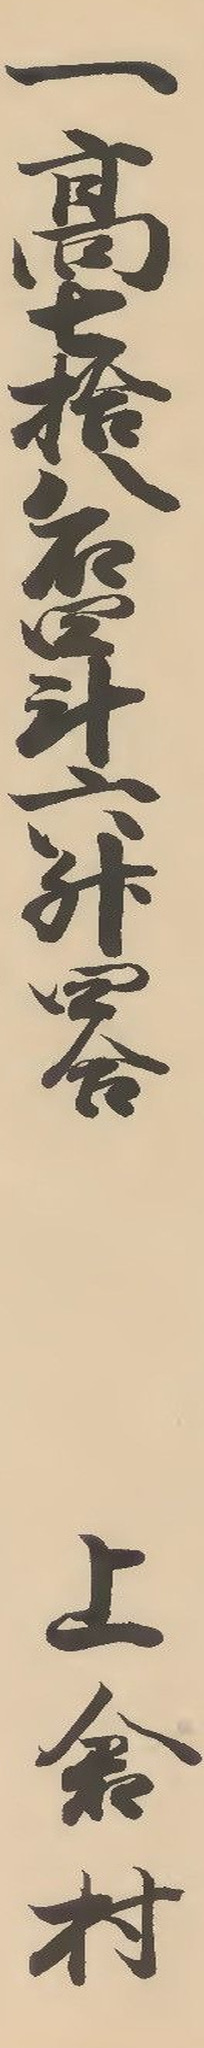一髙七拾八石四斗六升四合上倉村
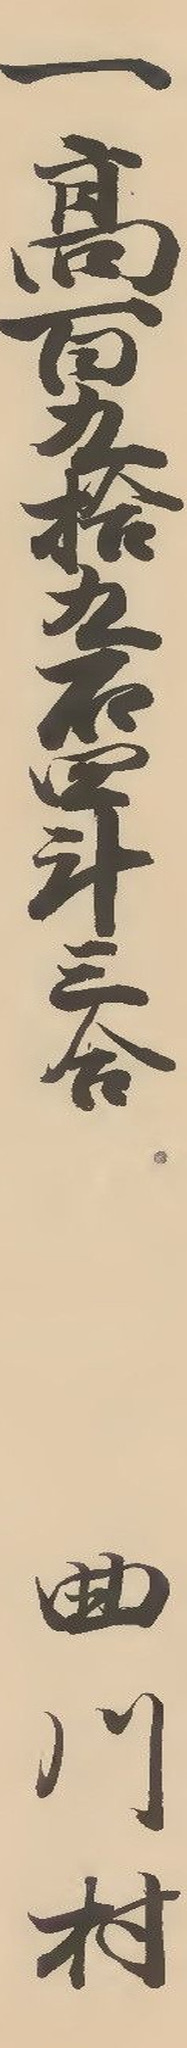一髙百九拾九石四斗三合曲川村
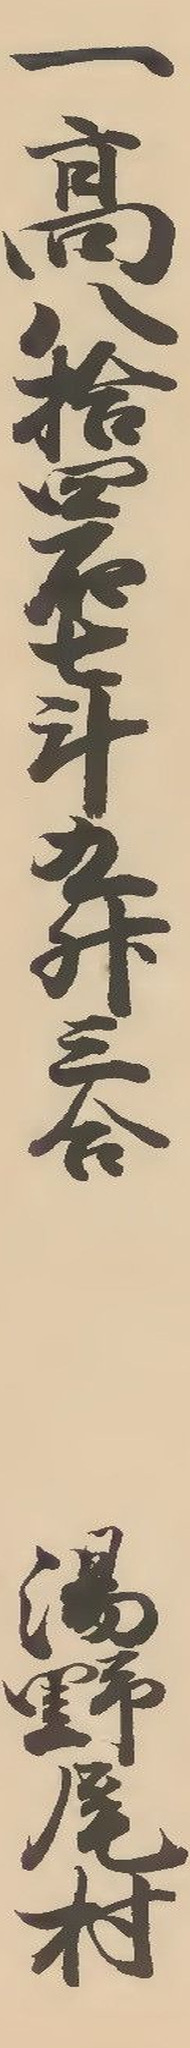一髙八拾四石七斗九升三合湯野尾村

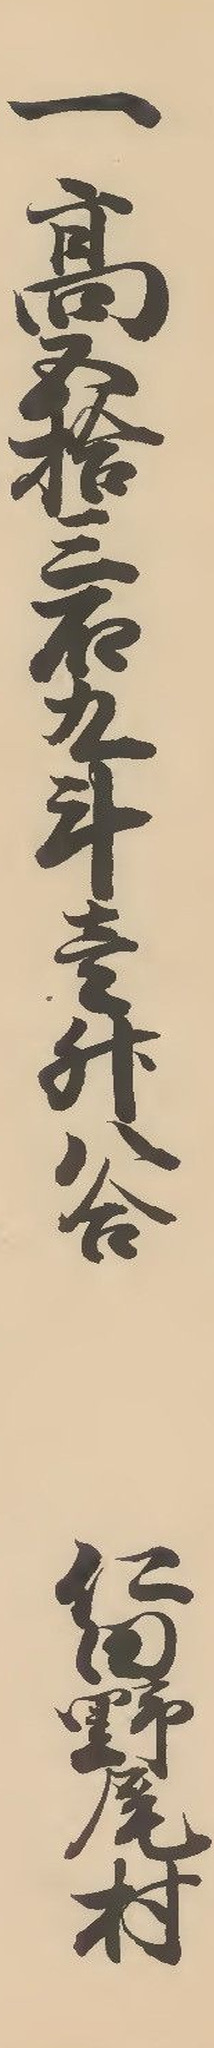一髙五拾三石九斗壱升八合仁田野尾村
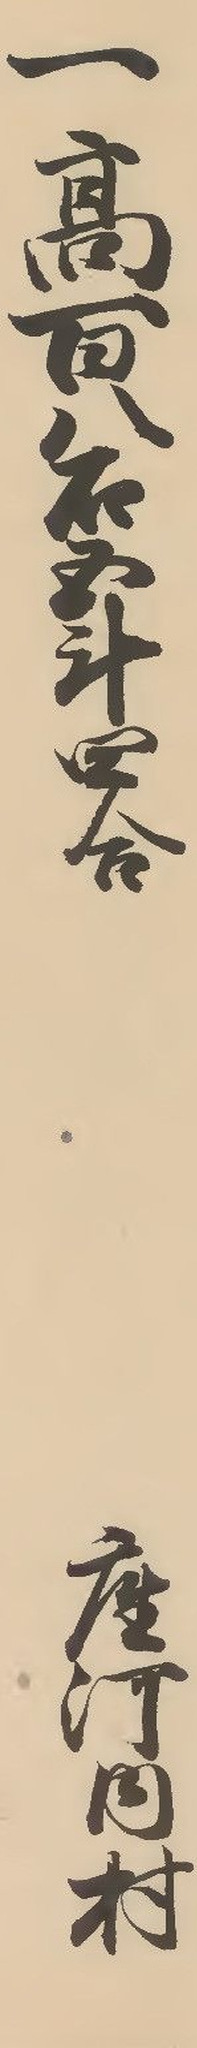一髙百八石五斗四合座河内村
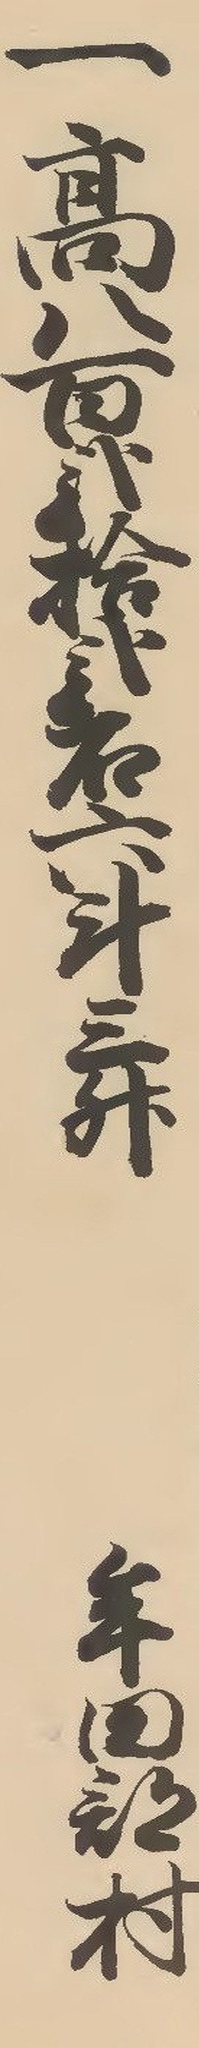一髙八百弐拾弐石六斗三升牟田部村
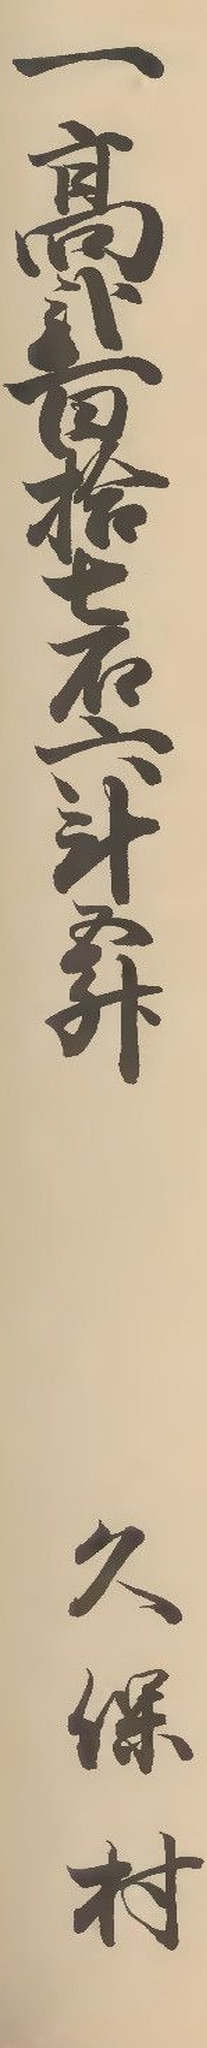一髙弐百拾七石六斗五升久保村
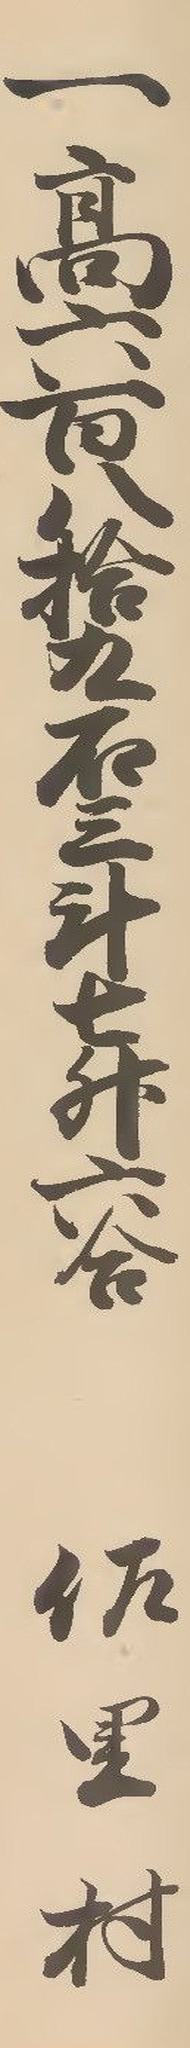一髙六百八拾九石三斗七升六合佐里村
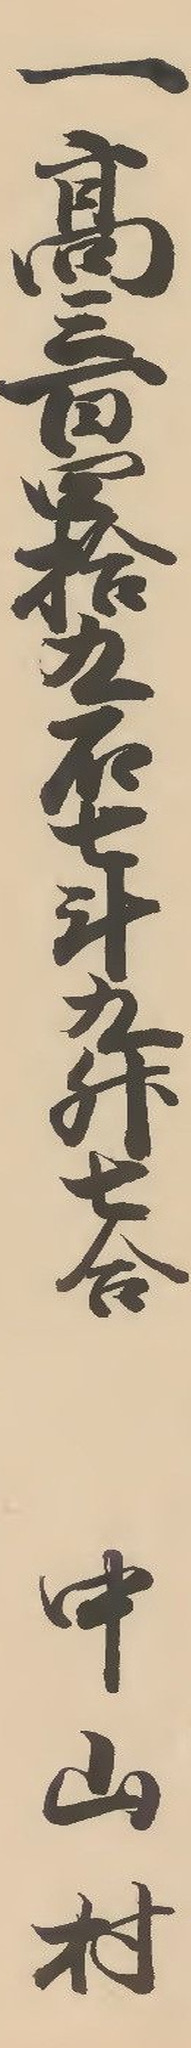一髙三百四拾九石七斗九升七合中山村
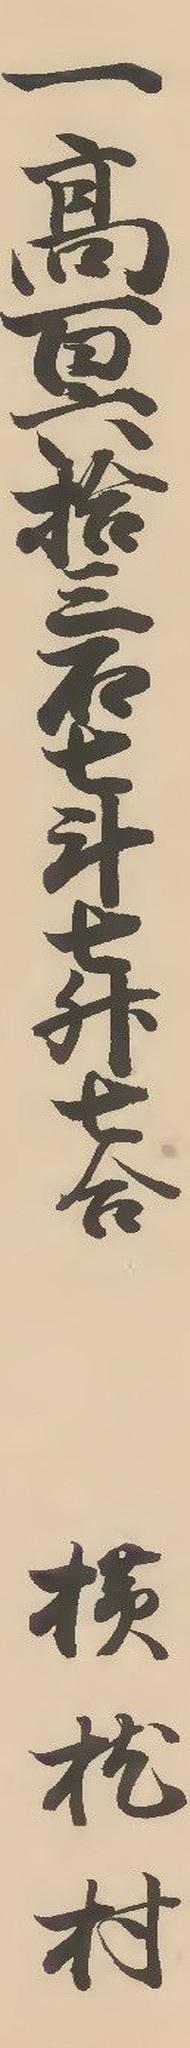一髙百六拾三石七斗七升七合横枕村
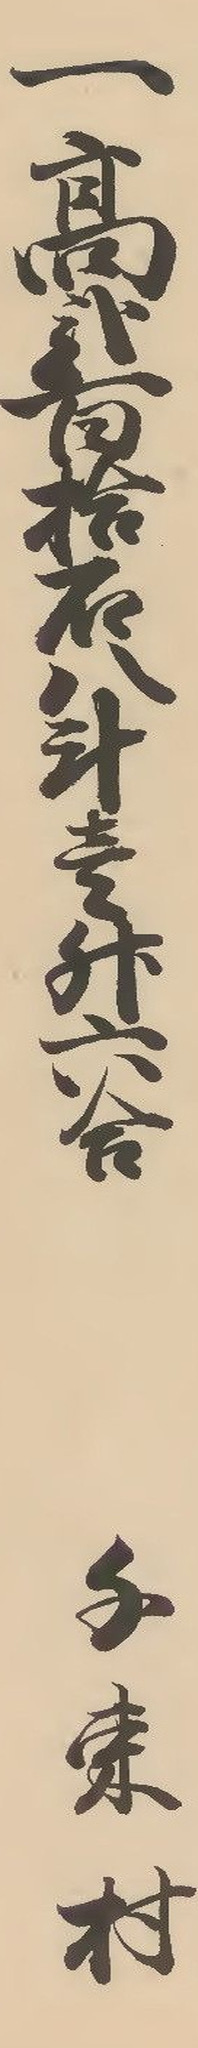一髙弐百拾石八斗壱升六合千束村

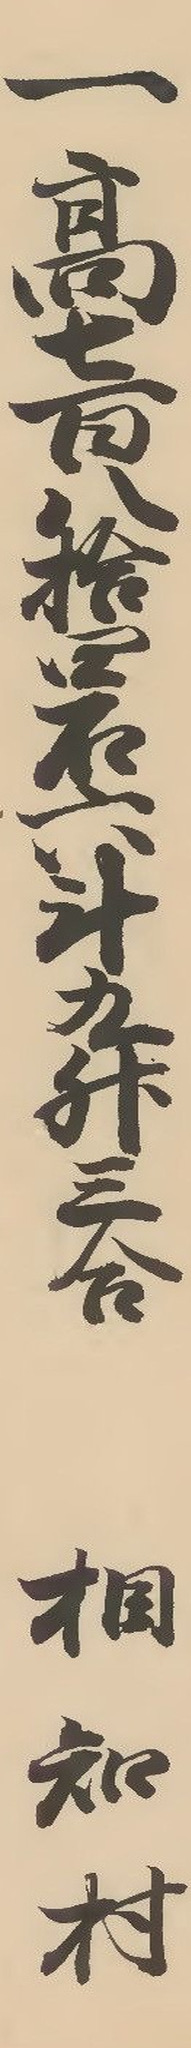一髙七百八拾四石六斗九升三合相知村
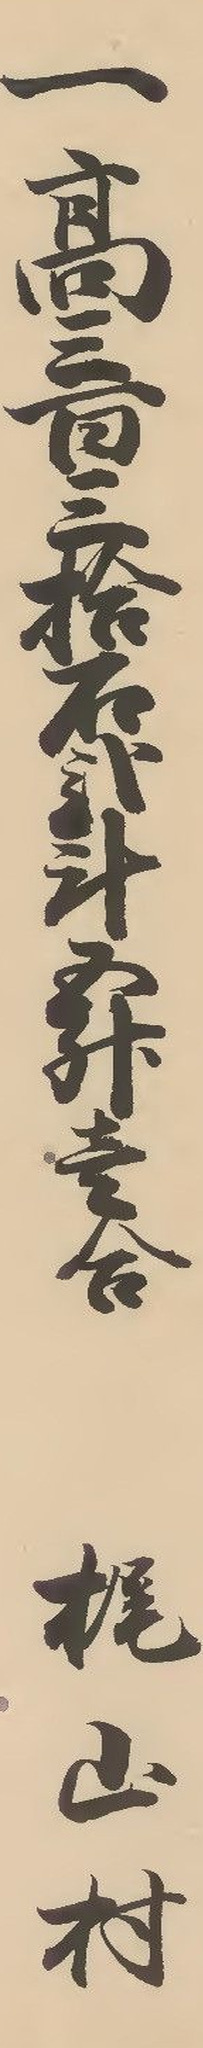一髙三百三拾石弐斗五升壱合梶山村
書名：肥前国郷帳
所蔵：国立公文書館 National Archives of Japan
